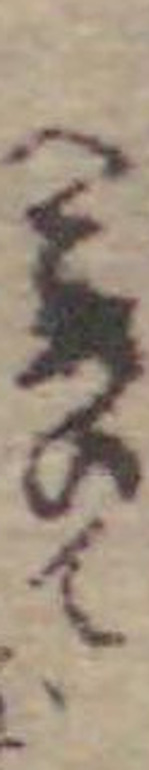へこついて
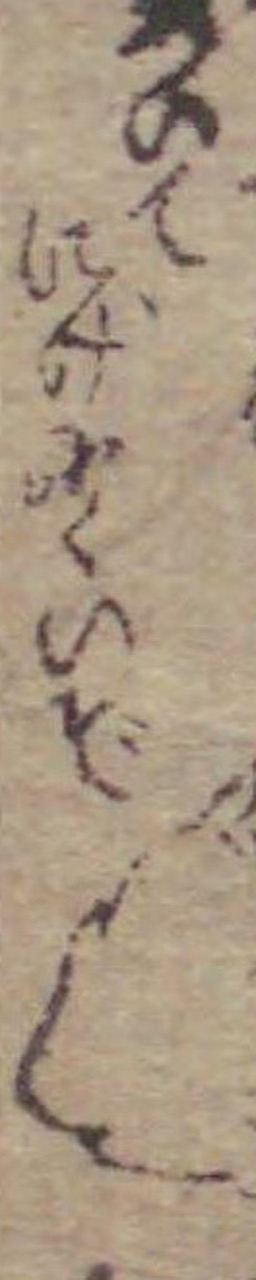にげにくいぞ

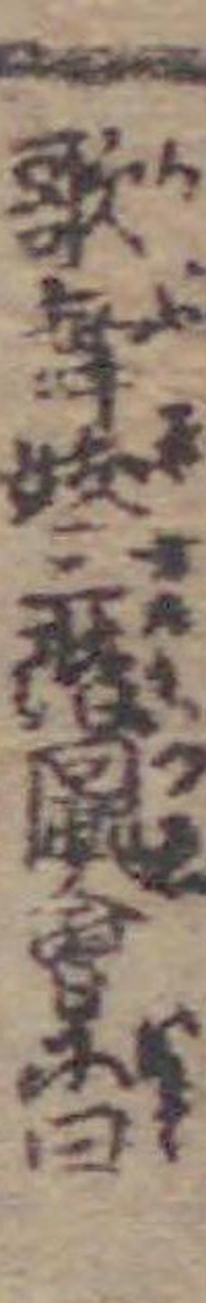歌舞伎三階図会に曰
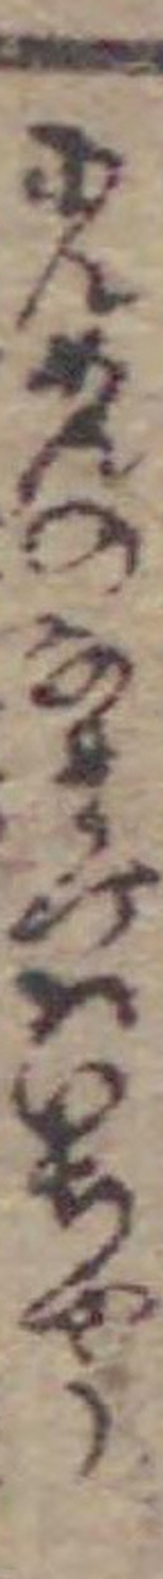にんめんのなまづはいちやう
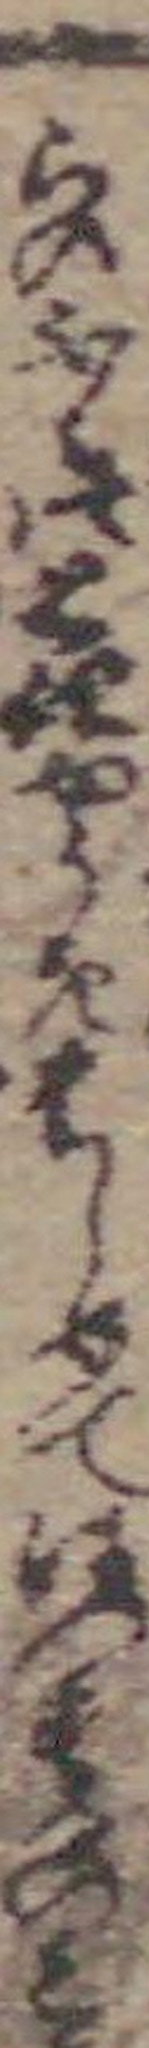らいふくのときやうきはしめてはつするのころ
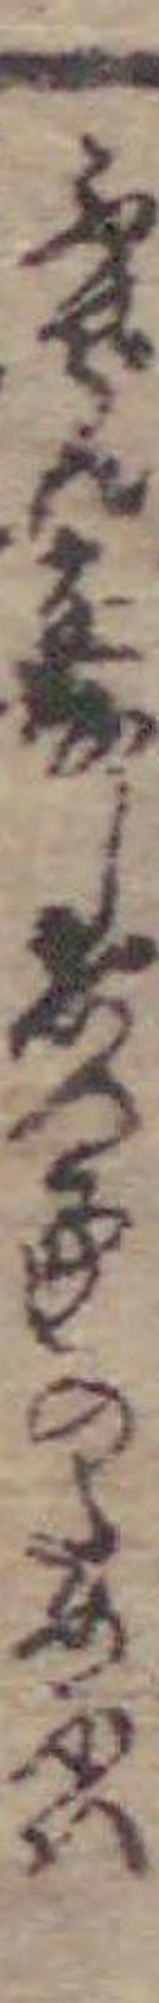ふぜんをなしじつ事しのためには
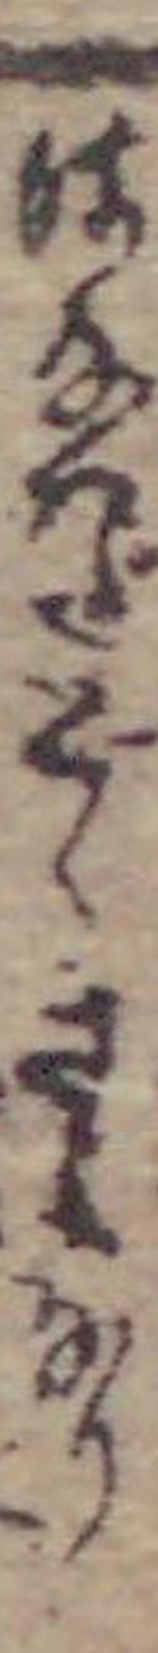はなはだとくきになり
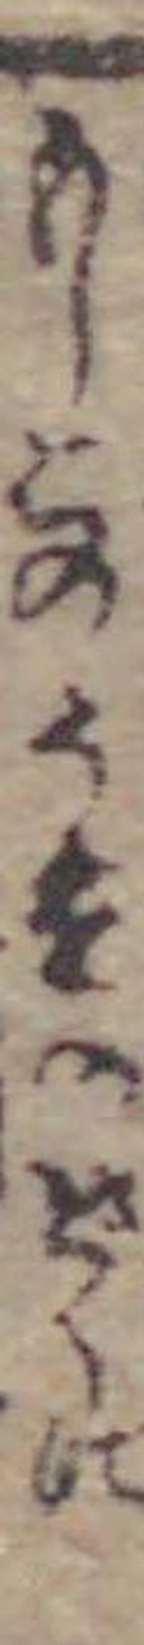もしこのうをのどくきに
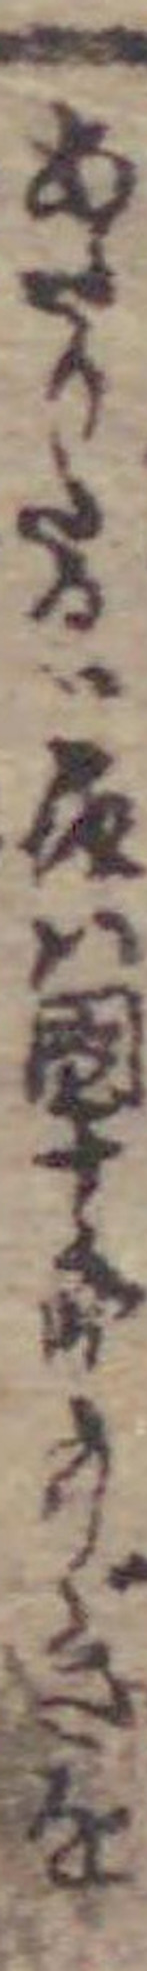あたりたるときは團十郎もぐさを
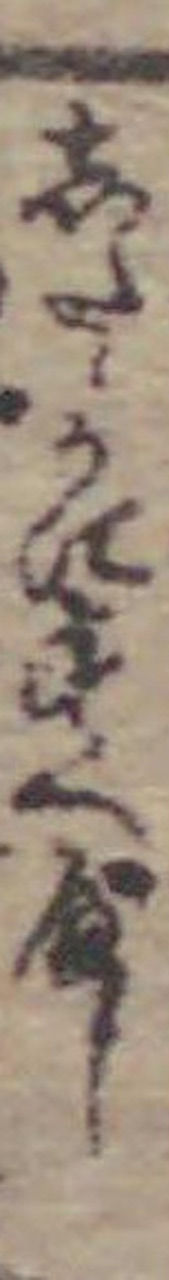したゝかにすへべし
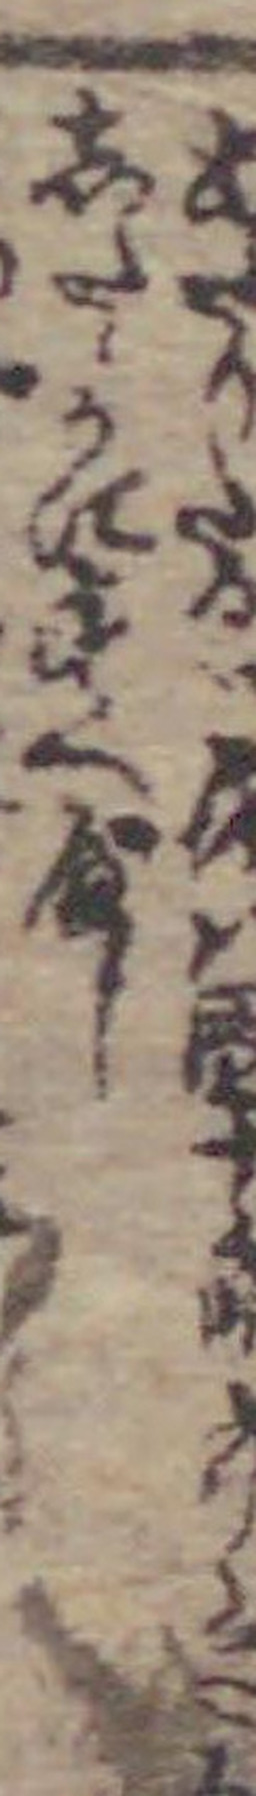したゝかにすへべし
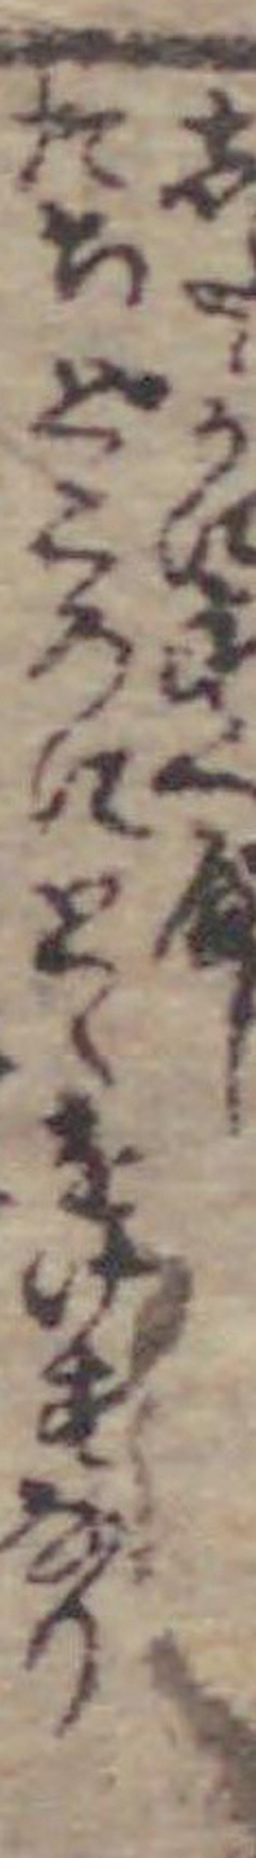たちどころにとくをけすなり
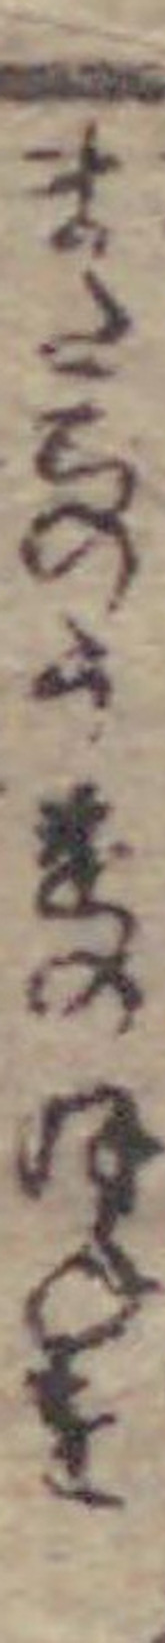またこのうをのほねを
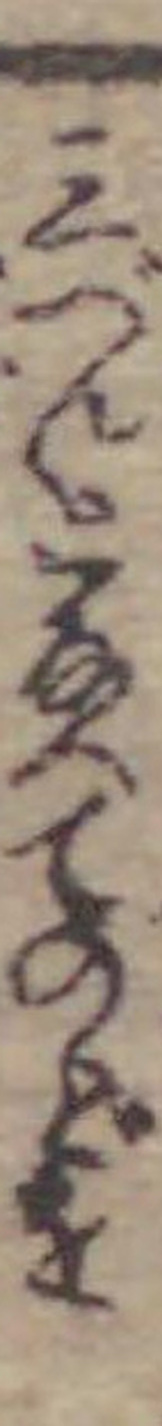三べんとなへてのどを
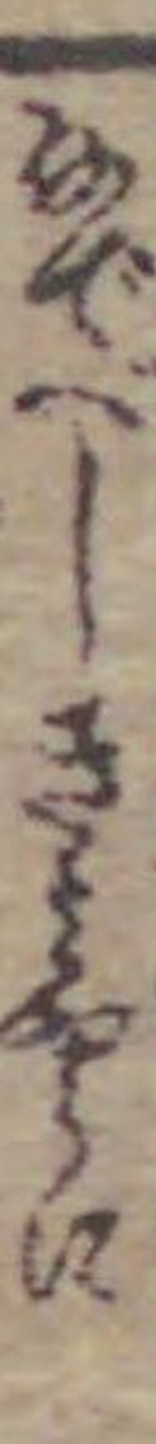なでべしきみやうに
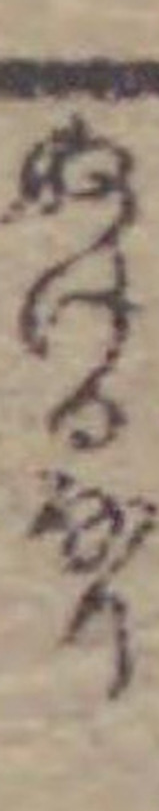ぬけるなり
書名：化物和本草 : 3巻
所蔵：国立国会図書館 National Diet Library, JAPAN
